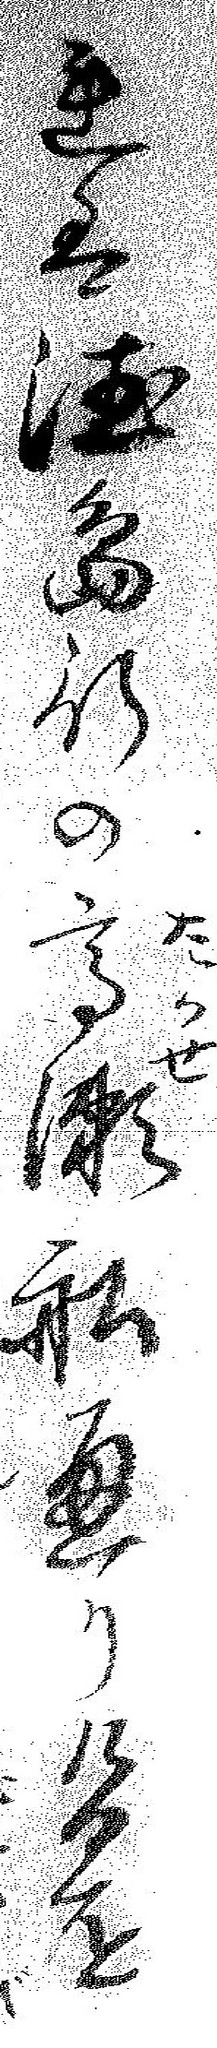れは徳島行の高瀬船通りけるを
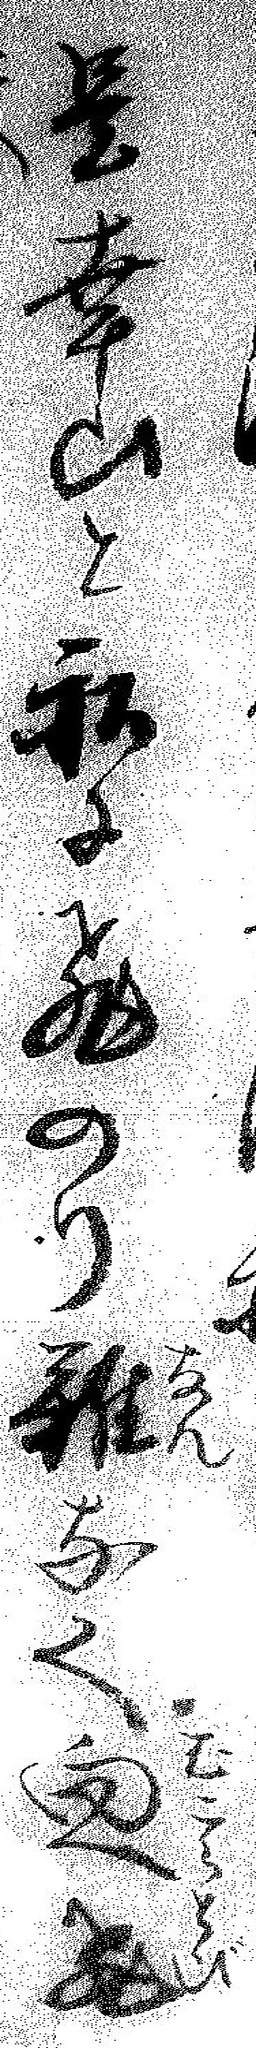是幸ひと船に飛のり難なく向へ飛
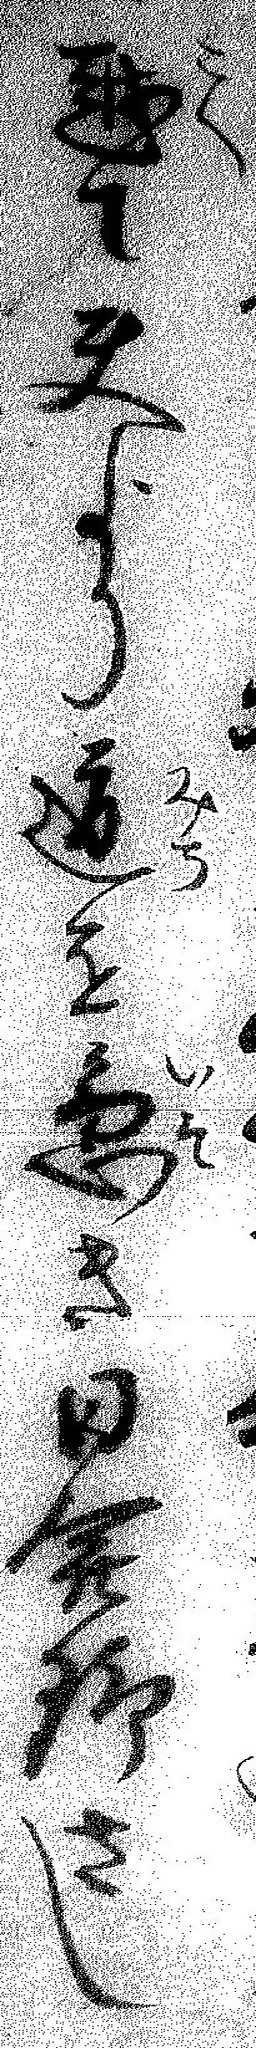越て夫より道を急き日開野さし

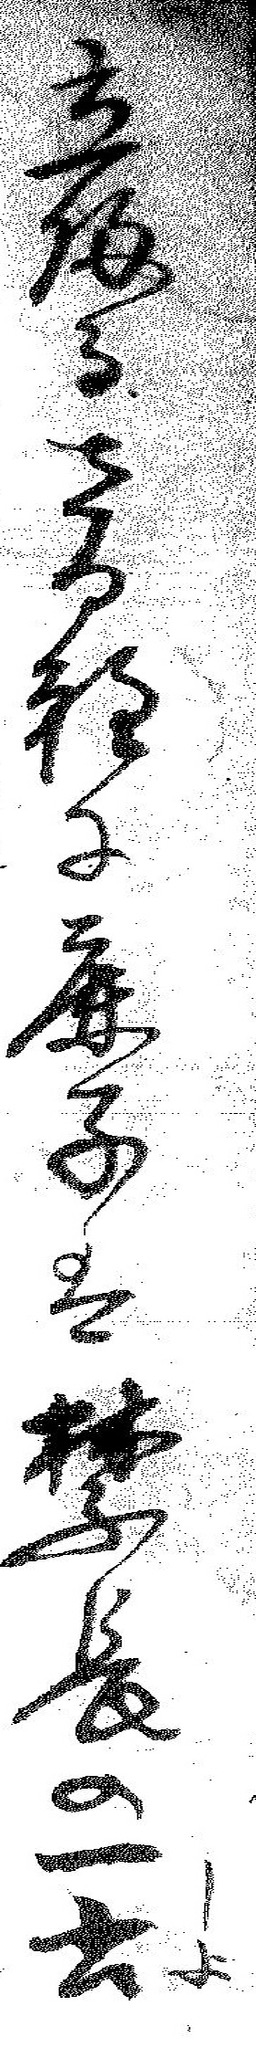立帰るさる程に鹿子は禁長の一書
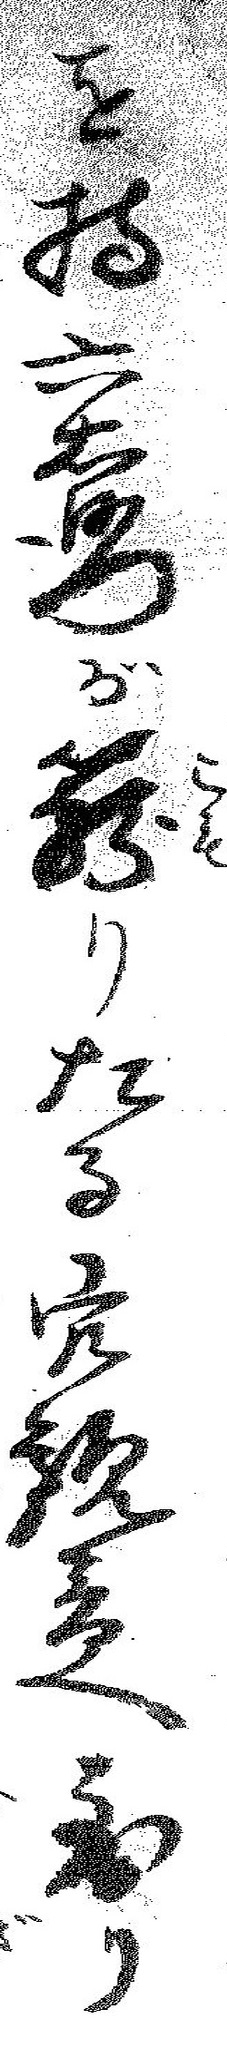を持六右衛門が籠りたる穴観音へ至り
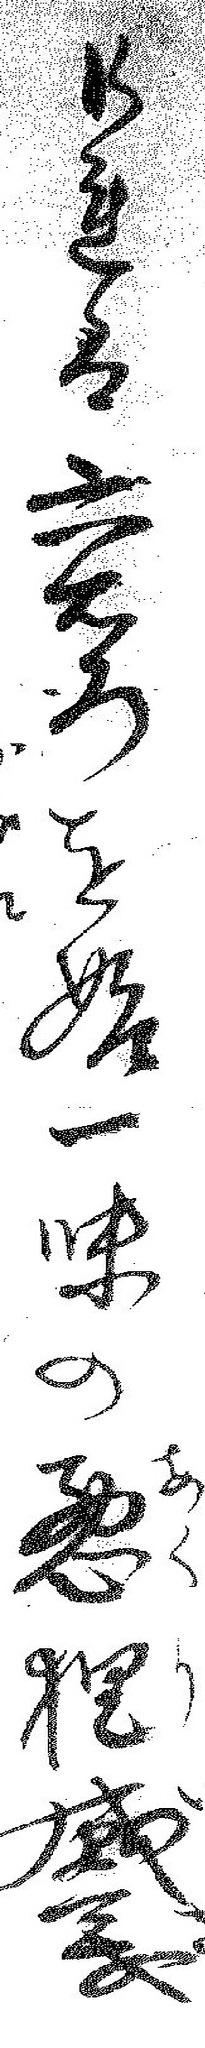ければ六右衛門を始一味の悪狸威義
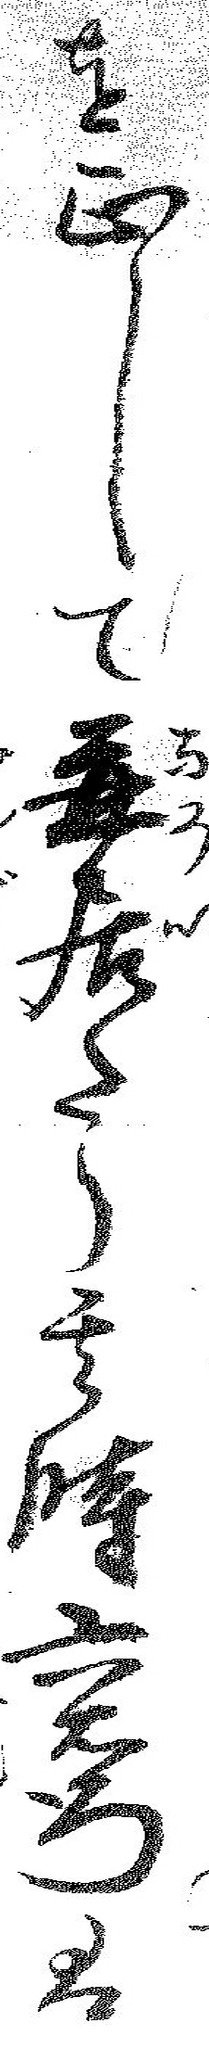を正して並居たり其時六右衛門は
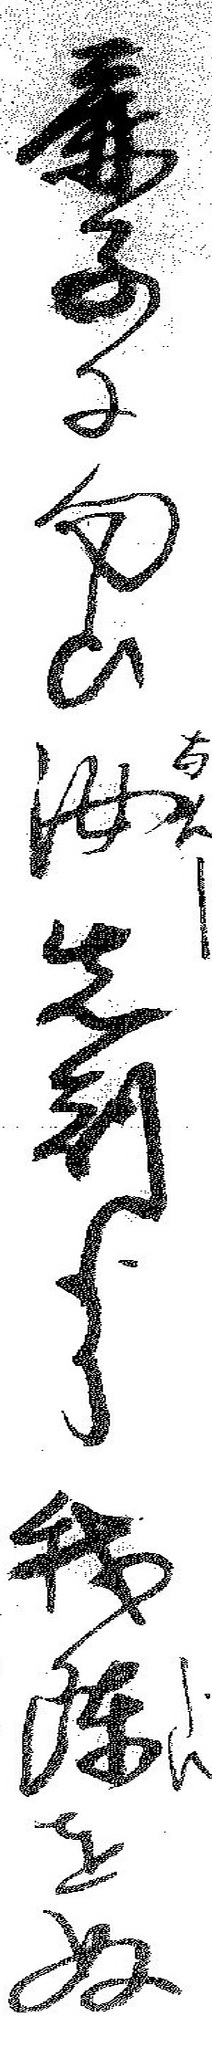鹿子に向ひ汝先刻より我陣をぬ
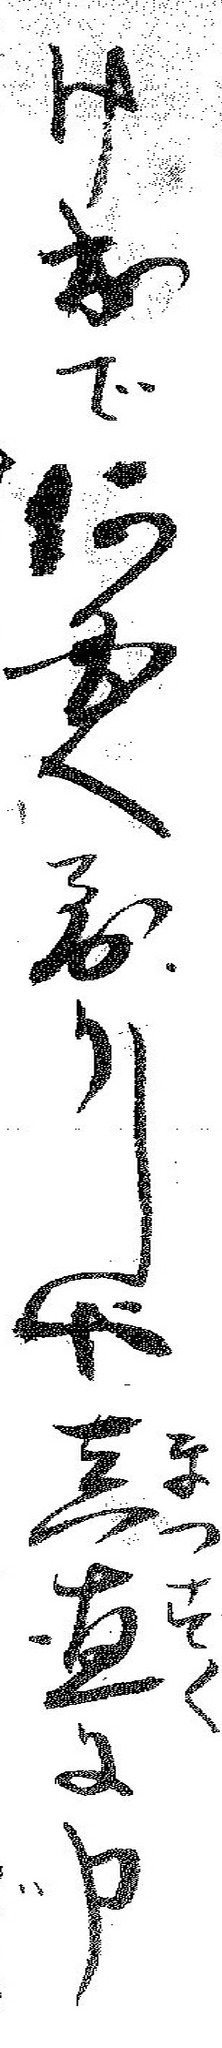け出で何国へ至りしや真直に申
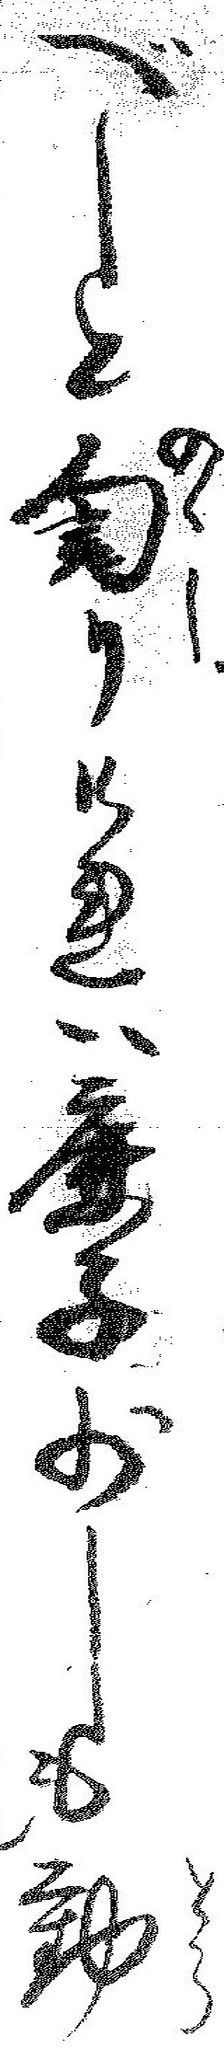べしと訇りけれは鹿子少しも動
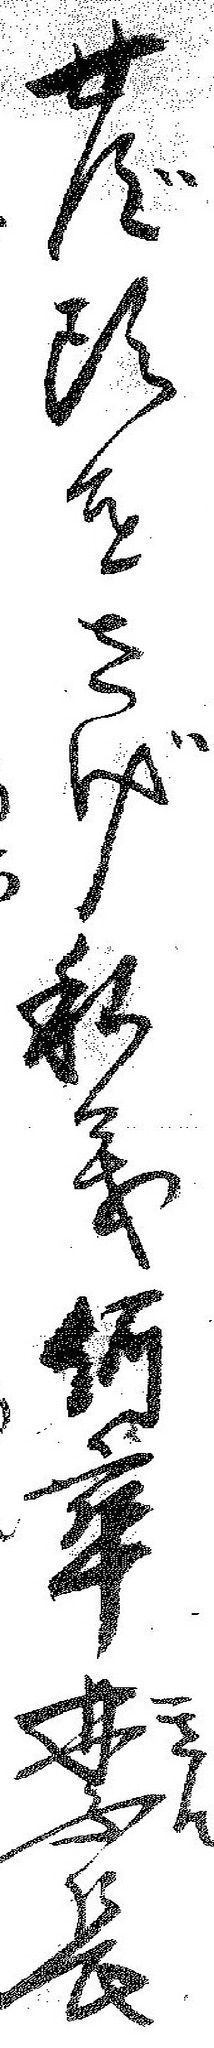ぜず頭をさげ私義何卒禁長
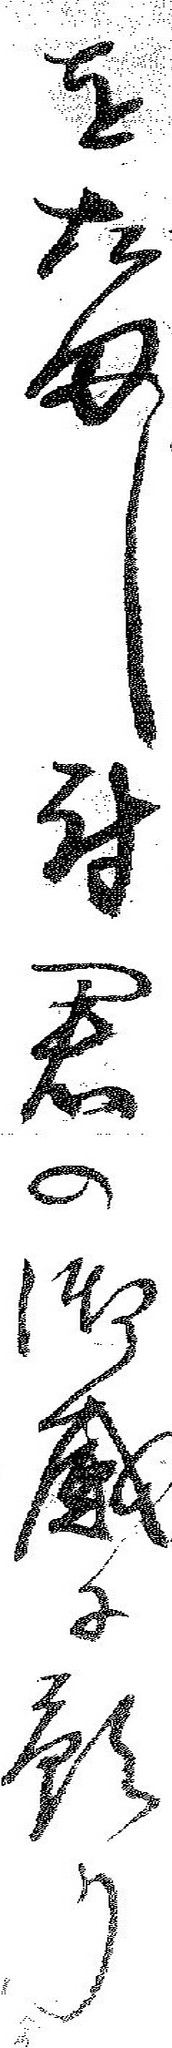をだまし討君の御感に預り
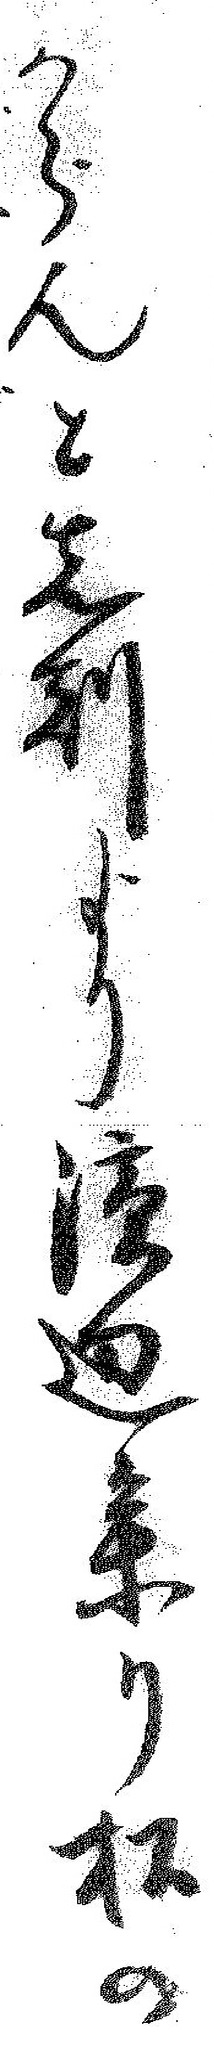からんと先刻より浜辺参り松の
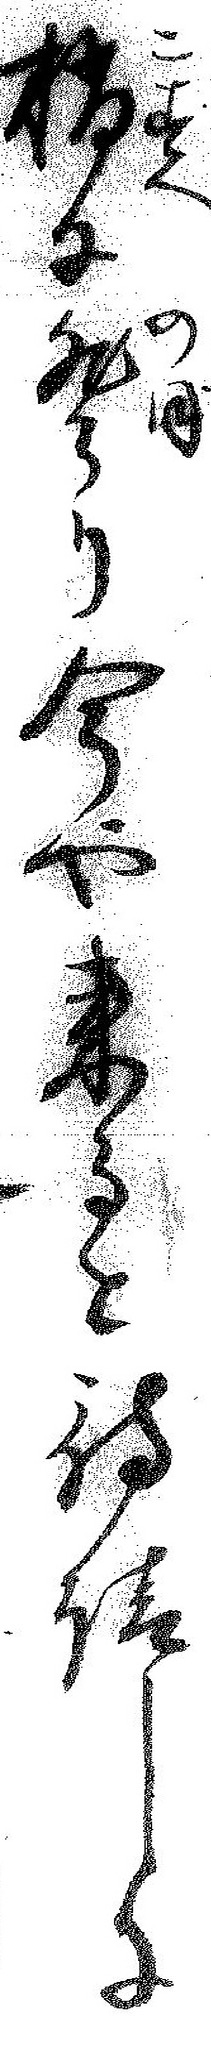梢に登り今や来ると待請しに
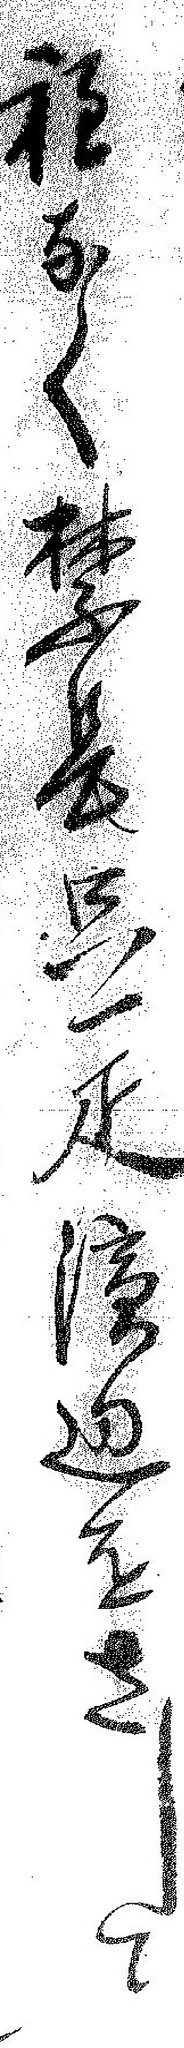程なく禁長只一疋浜辺をさして
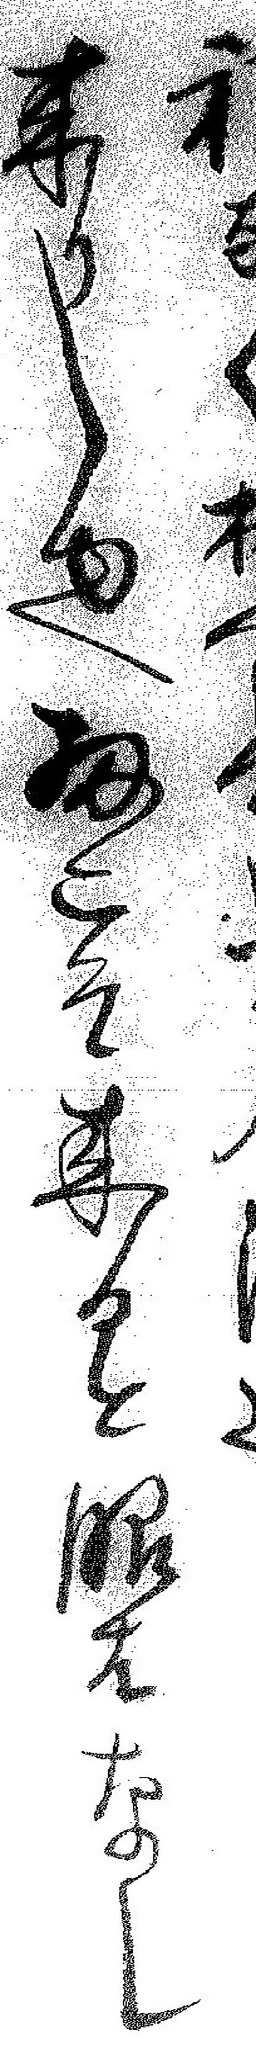来りしゆへ扨こそ来ると眼はなし
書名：近頃古狸珍説　礼義智信
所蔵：徳島県立図書館
